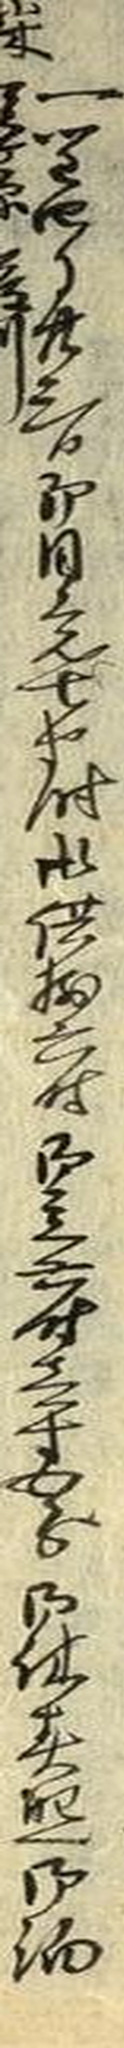一閏四月廿三日御目覚七半時御供揃六時御立六時壱寸五分御休春照御泊
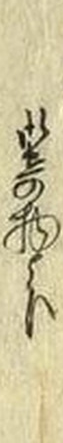御寄物被下
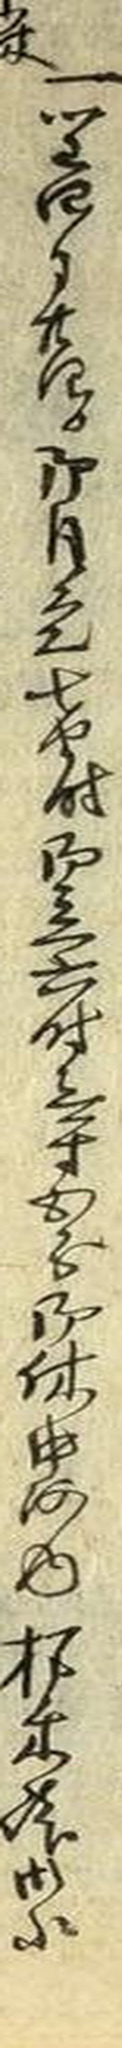一閏四月廿四日御目覚七半時御立六時壱寸五分御休中河内栃ノ木峠御小
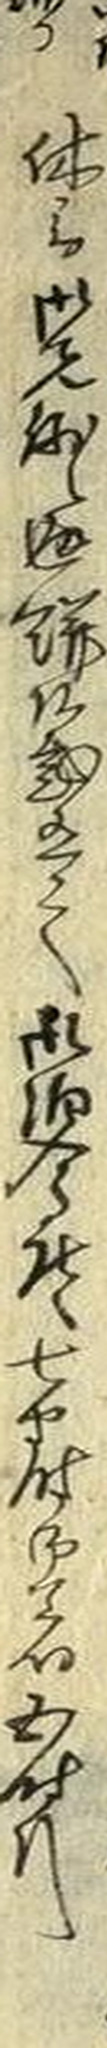休ニ而御先例之通餅頂戴有之御泊今庄へ七半時御着五時引
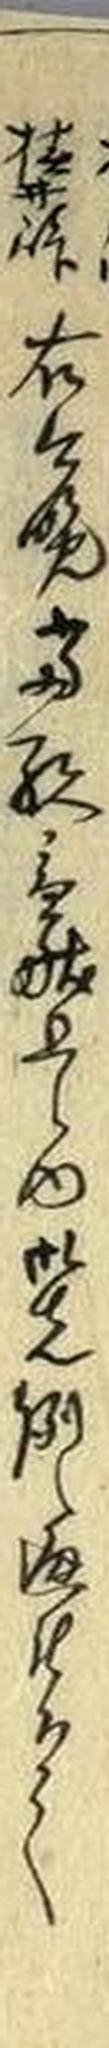右今晩当駅ニ而献上之内御先例之通被下之
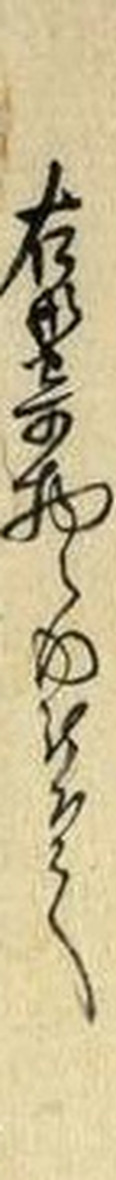右御寄物之内被下之
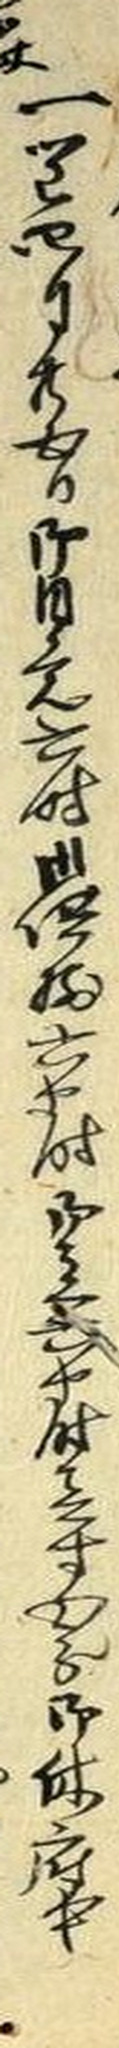一閏四月廿五日御目覚六時御供揃六半時御立六半時壱寸五分御休府中
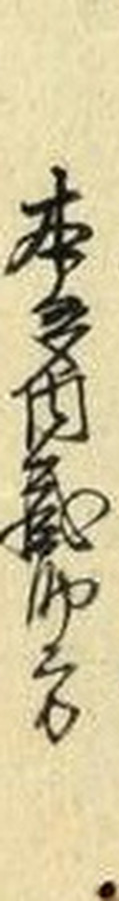本多内蔵助方
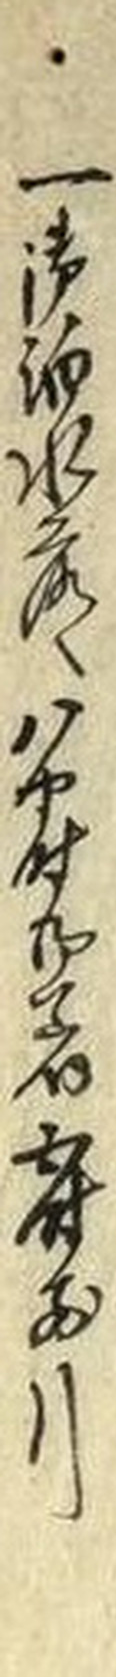一御泊水落へ八半時御着五時前引
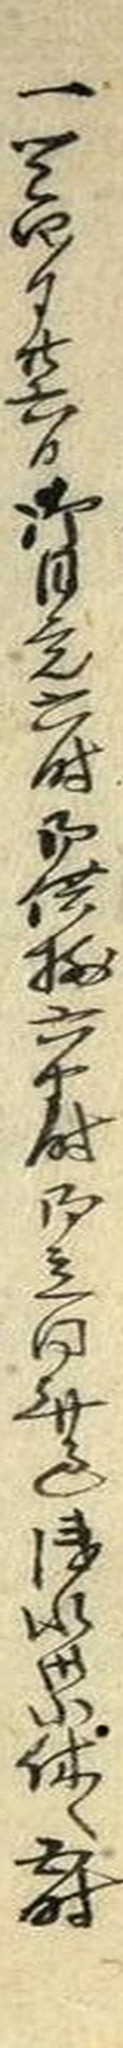一閏四月廿六日御目覚六時御供揃六半時御立同刻過浅水御小休へ五時
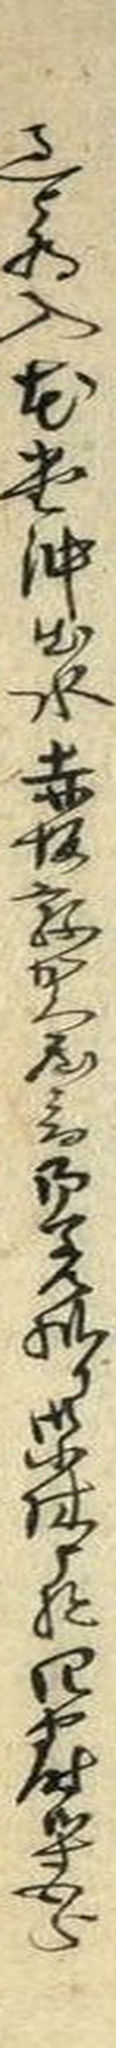過被為入花堂沖出水赤坂敦賀屋ニ而御差掛り御小休被遊四半時弐寸五分
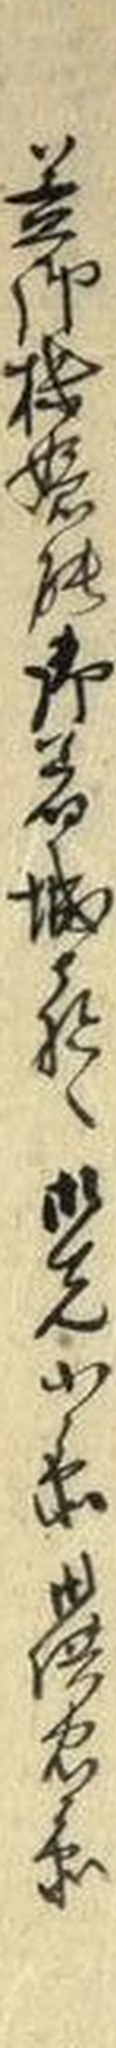益御機嫌能御着城被遊候御先小兵衛御供忠兵衛

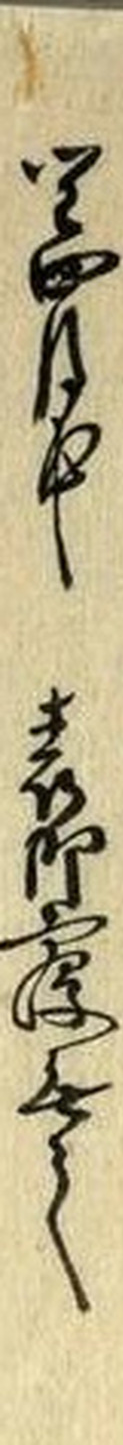閏四月中表御寝無之
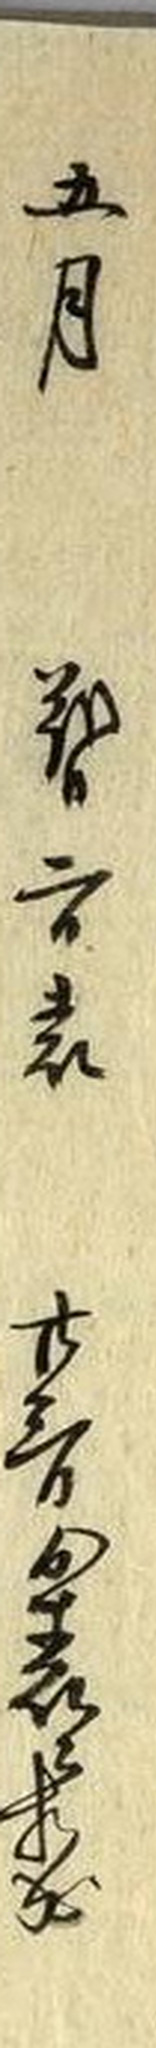五月朔日二日表廿三日ゟ表ニ相成
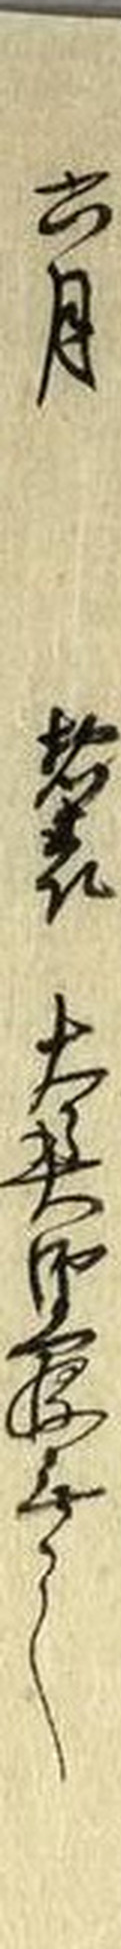六月惣表大奥御寝無之
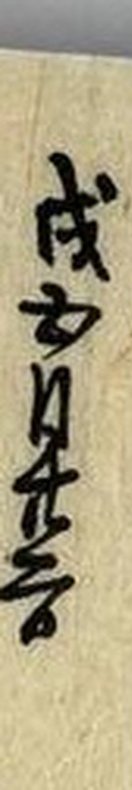戌五月廿二日一
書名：少傅日録抄（斉善付側向頭取日記、江戸并道中、初入在国、逝去後…
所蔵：福井県文書館 Fukui Prefectural Archives
